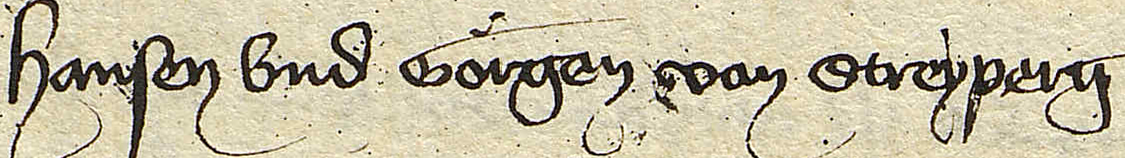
hanſen vnd Görgen von Streyperg
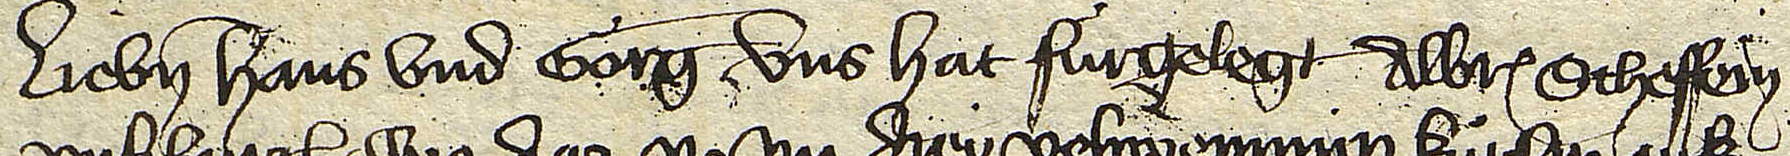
Liebn* hans vnd Görg / vns hat fürgelegt Albr* Scheffein
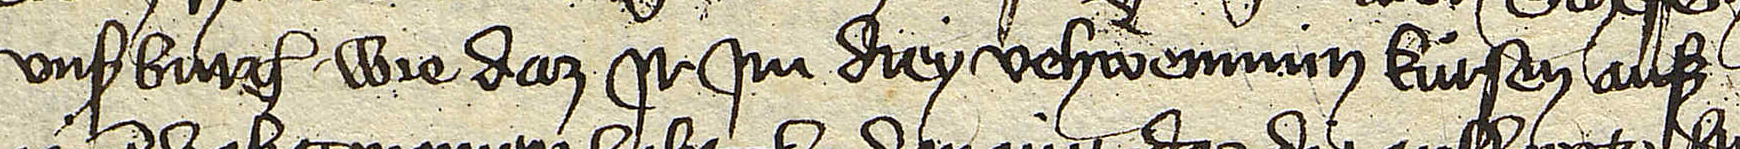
vnſ* burg* / wie daʒ Ir Im drey vehwemmin kürſen auſʒ
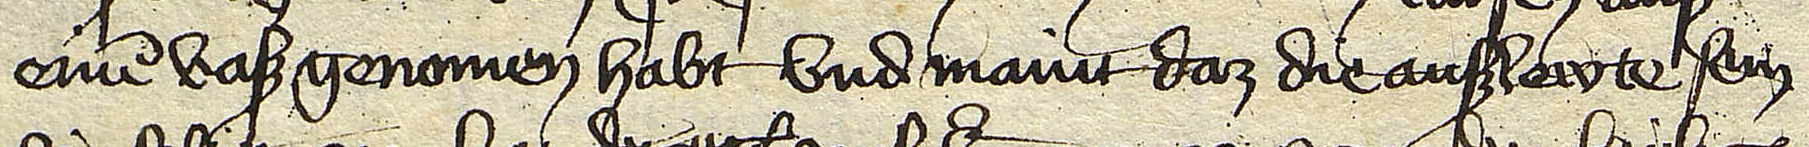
eine* vaſʒ genomen habt / vnd maint daʒ die auſʒlewte ſein
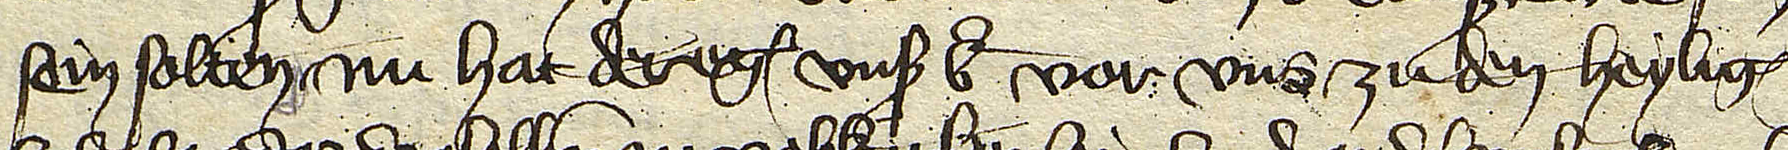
ſein ſolten / Nu hat dereg* vnſ* b* vor vns cʒu den heylig*
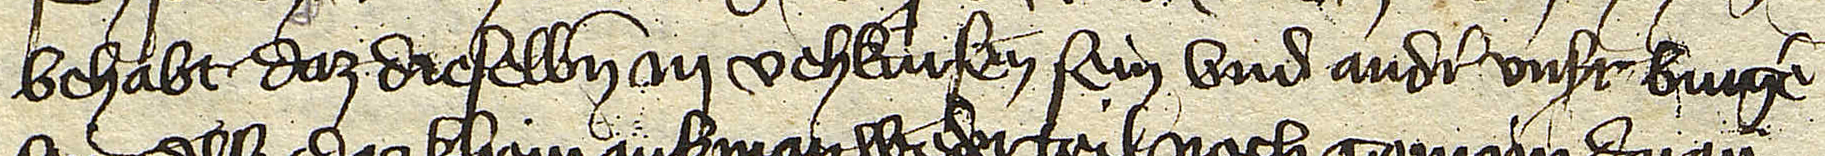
behabt / daʒ dieſelbn* iii vehkürſen ſein vnd andr* vnſ*r burge*
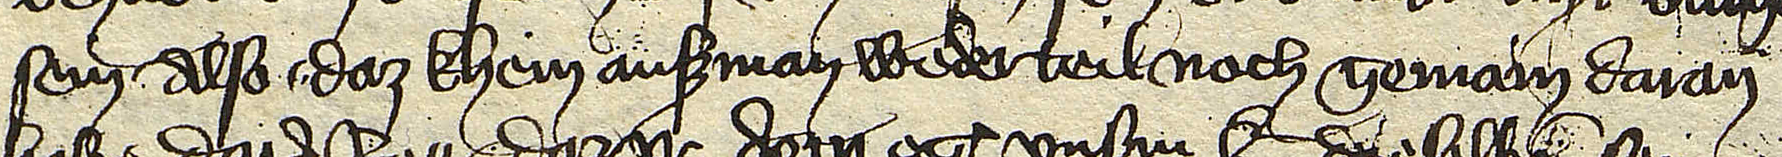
ſein / Alſo / daʒ khein auſʒman weder teil noch gemain daran
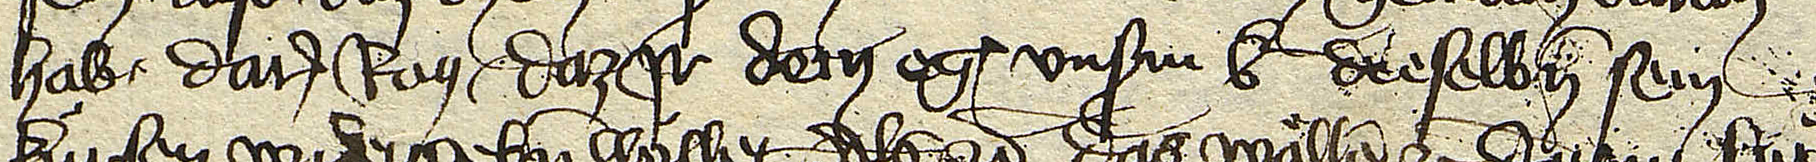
hab / dar* Ro* / daʒ Ir dem eg* vnſ*m b* dieſelbn* ſein
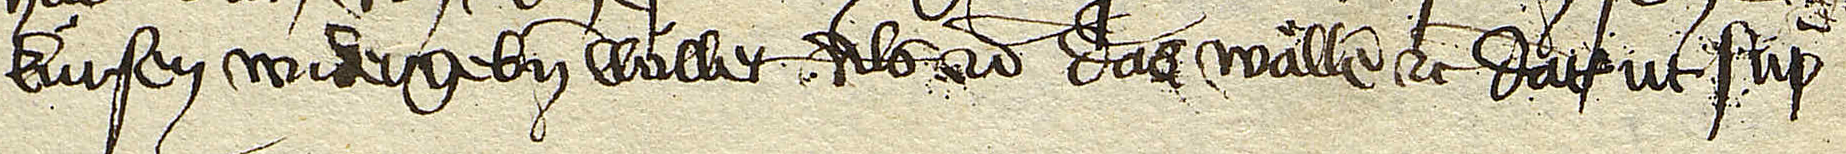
kürſen widergebn* wöllet / Als ec* das wölle* ec* dat* ut ſup
